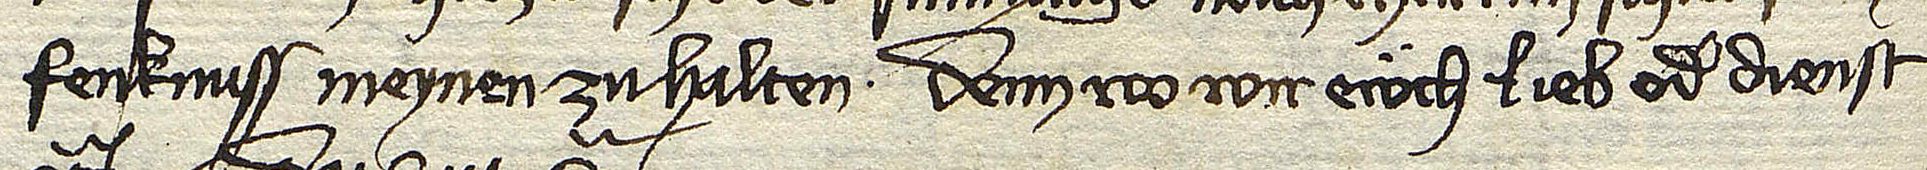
fenknuſſ meynen ʒu halten . Denn wo wir ewch lieb od* dienſt
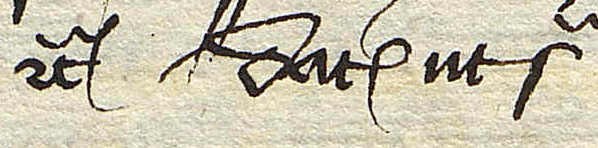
ec* / Dat* ut ſ*
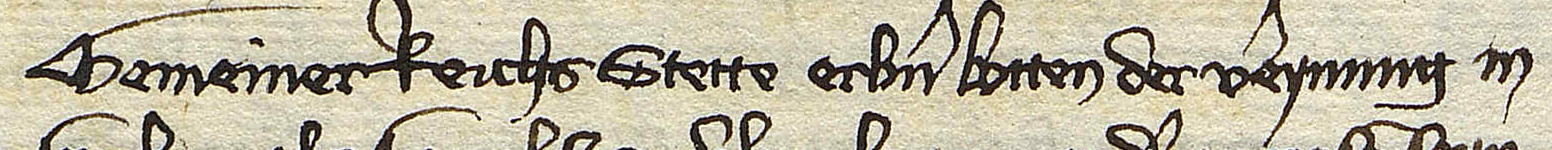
Gemeiner Reichs Stette erbn* botten der v*eynung in
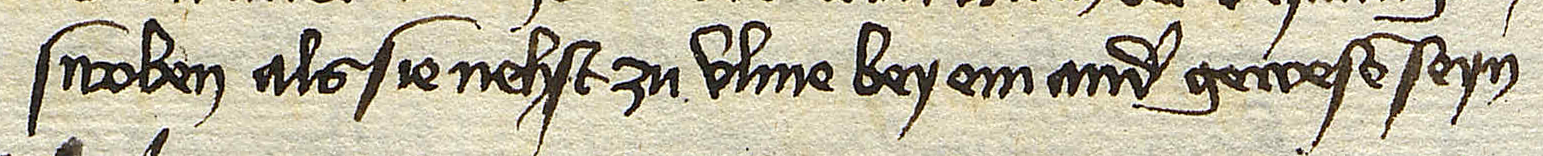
ſwoben als ſie nehſt ʒu Vlme bey ein and* geweſe* ſeyn
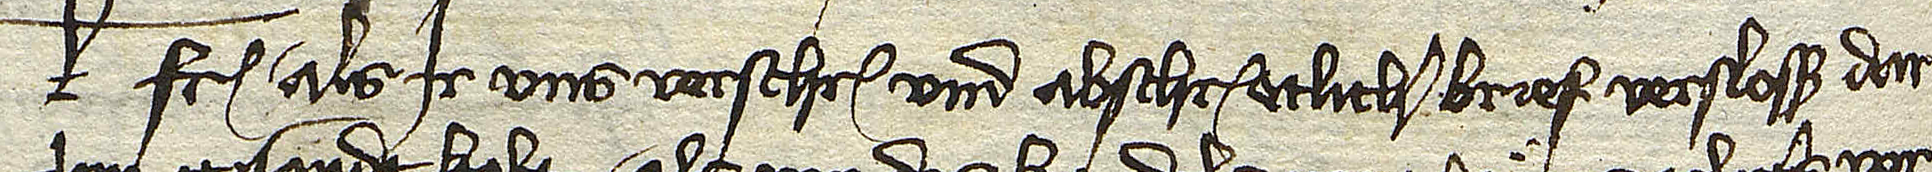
L* fr* / als Ir vns verſchr* vnd abſchr* etlich* brief verſloſſ* dar
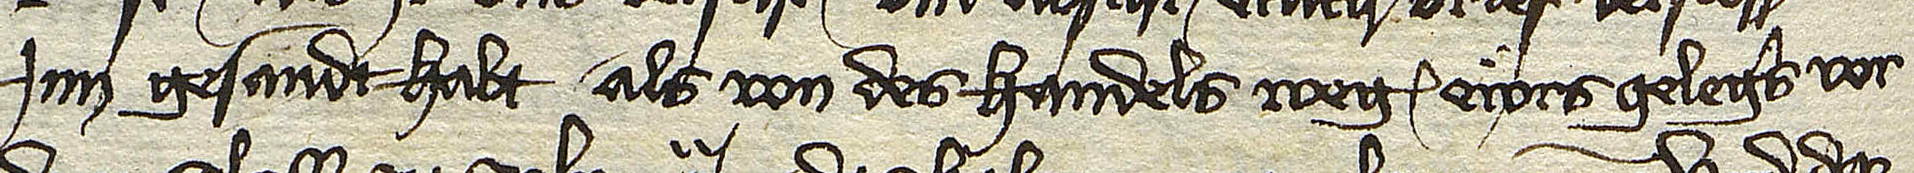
Inn geſandt habt / als von des handels weg* ewrs gelegs* vor
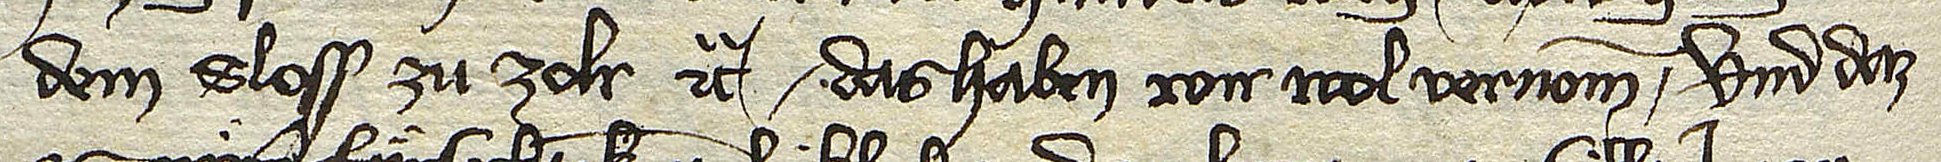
dem Sloſſ ʒu ʒolr ec* / . das haben wir wol vernom* / Vnd daʒ
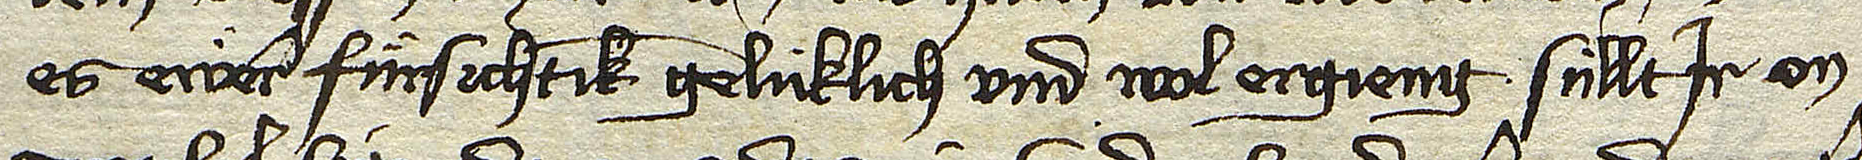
es ewer fürſichtik* gelüklich vnd wol ergieng . ſüllt Ir on
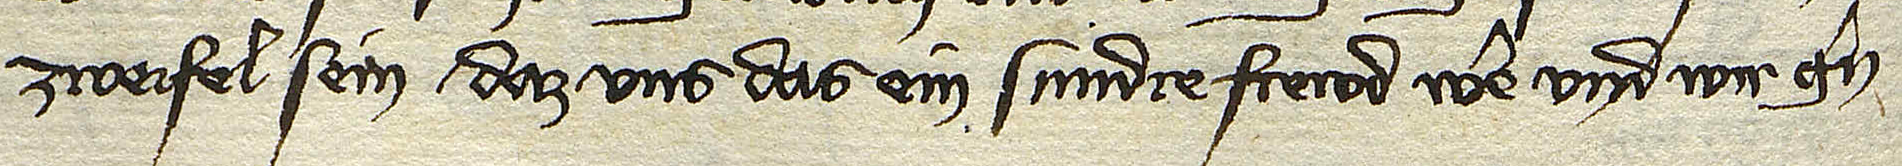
ʒweifel ſein / daʒ vns das ein ſundre frewd w*e vnd wir g*n
